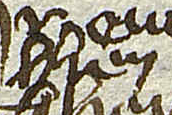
h*ren
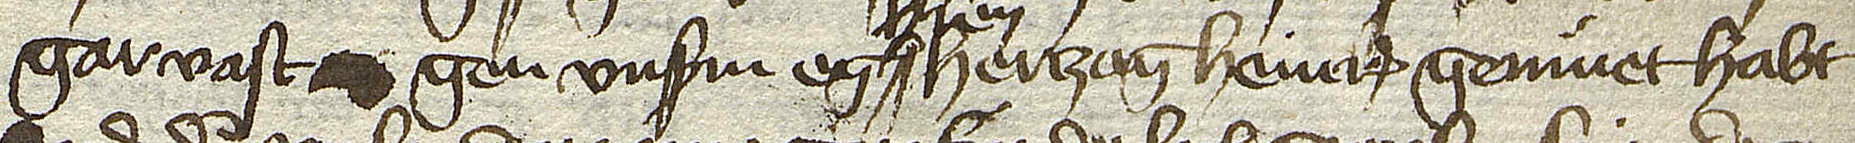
gar vaſt gen vnſ*m eg* hercʒog heinr* gemüet habt
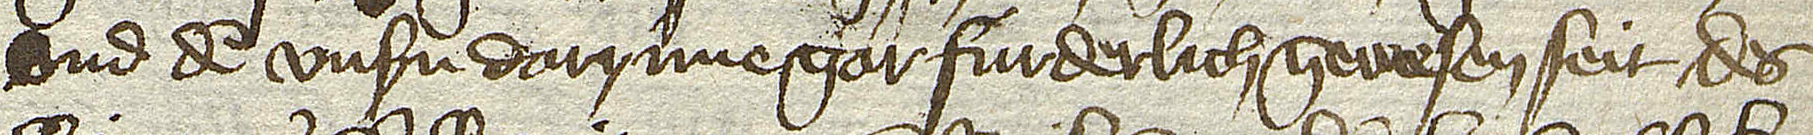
vnd d* vnſ*n darynne gar fürderlich geweſen ſeit / des
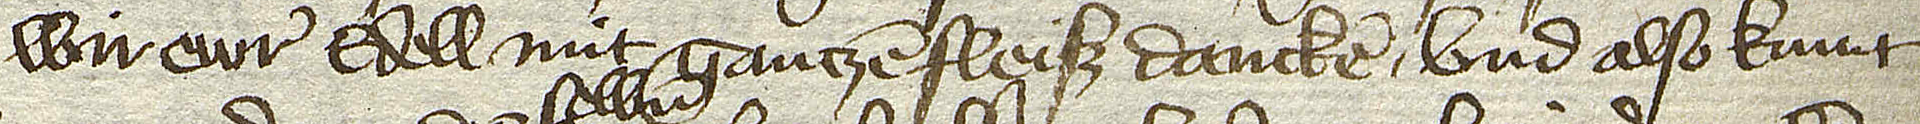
wir ew*r Edell mit gancʒe* fleiſʒ dancke* / vnd alſo kumt
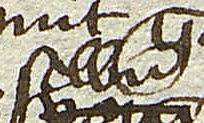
ſelb*n
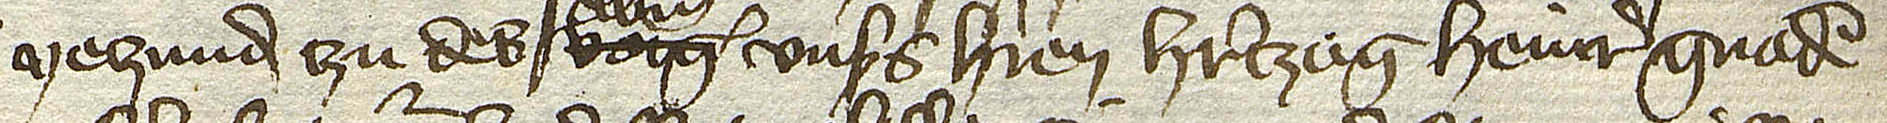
yecʒund* cʒu des vorg* vnſ*s h*ren h*rcʒog heinr* gnad*
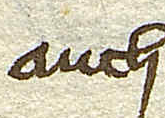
auch
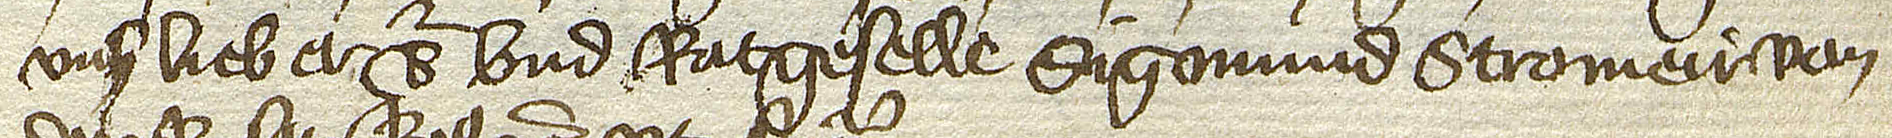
vnſ* lieber B* vnd Ratgeſelle Sigmund Stromeir von
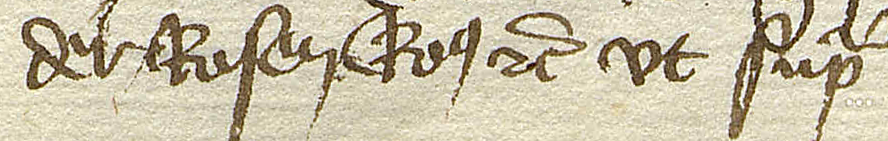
der Roſen Ro* ec* vt ſup*
